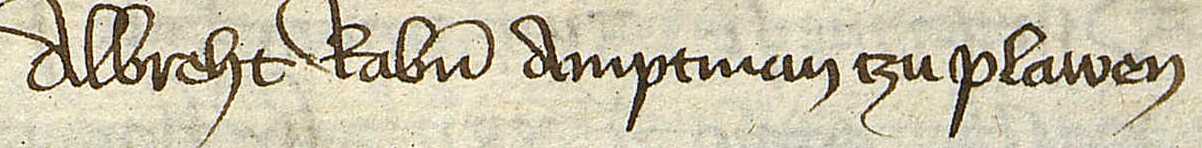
Albreht Rabn* Amptman cʒu Plawen
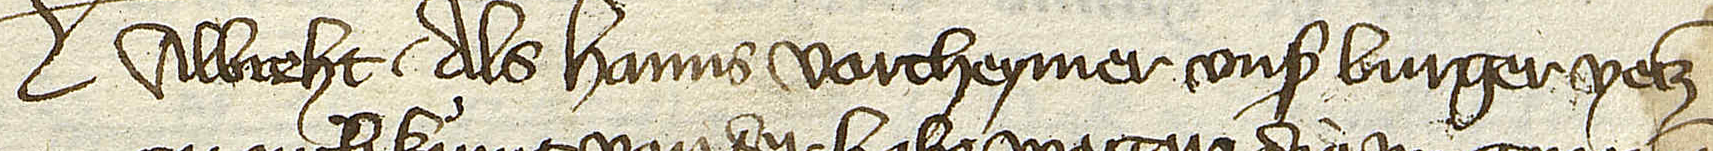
L* Albreht / Als hanns Vorcheymer vnſ* burger yecʒ*
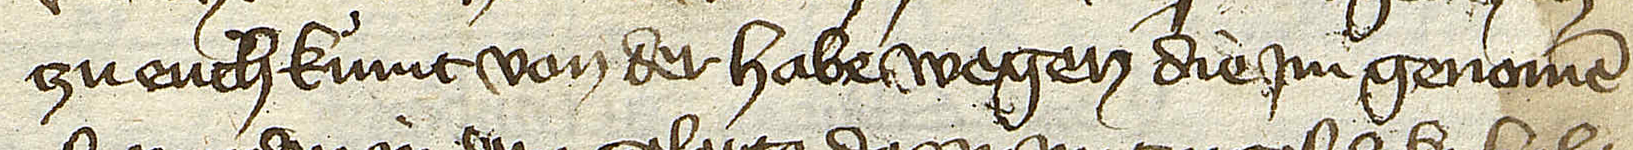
cʒu euch kümt von der habe wegen die Im genome*
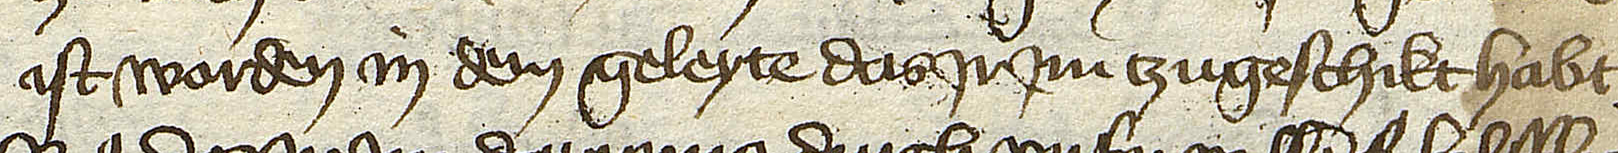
iſt worden in dem geleyte das Ir Im cʒugeſchikt habt
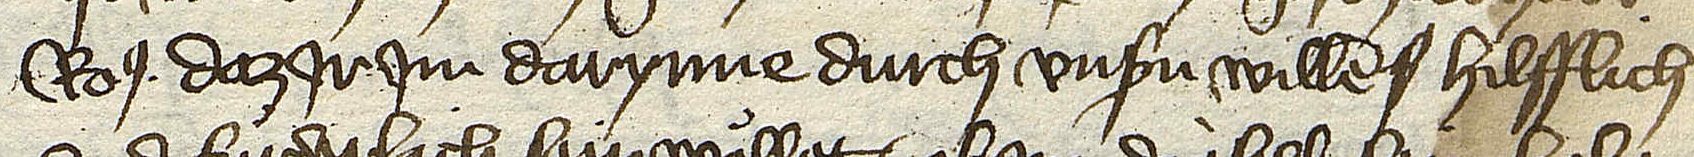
Ro* . daʒ Ir Im darynne durch vnſ*n wille* f hilfflich
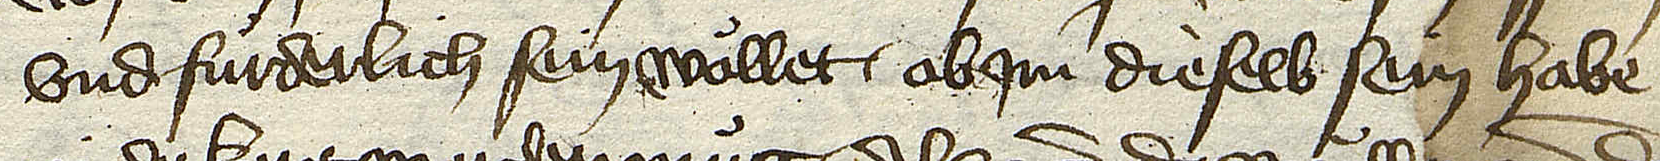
vnd fürderlich ſein wöllet / ob Im dieſelb ſein habe
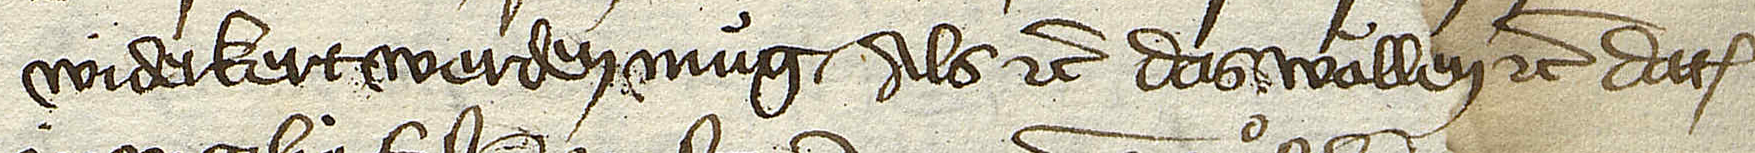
widerkert werden müg / Als ec* das wöllen ec* Dat*
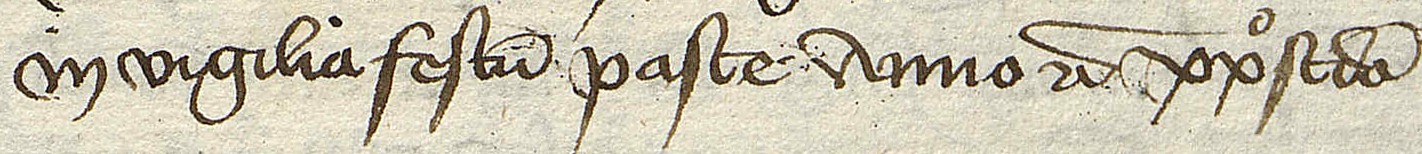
in vigilia feſtu* paſce . Anno ec* xx* ſcdo*
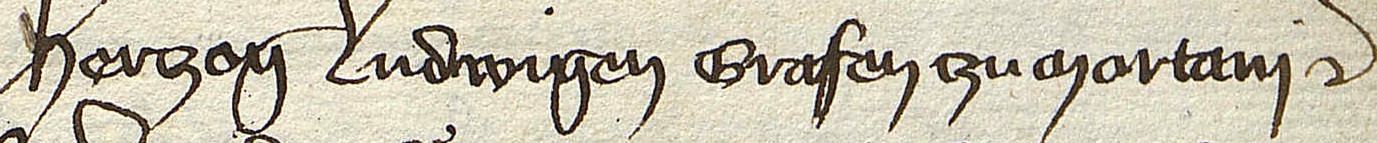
hercʒog Ludwigen Grafen cʒu Mortani ec*
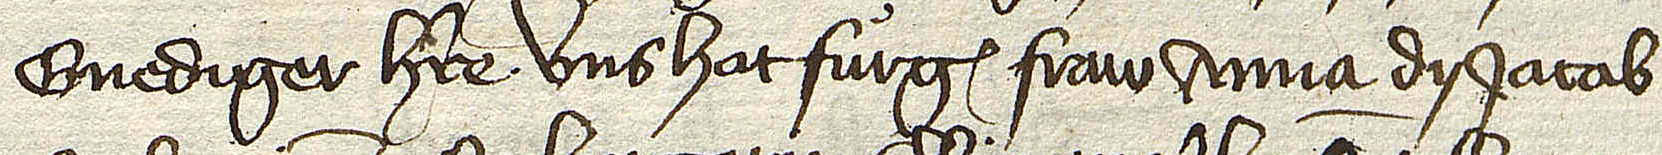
Gnediger h*re . Vns hat fürg* fraw Anna dy Iacob
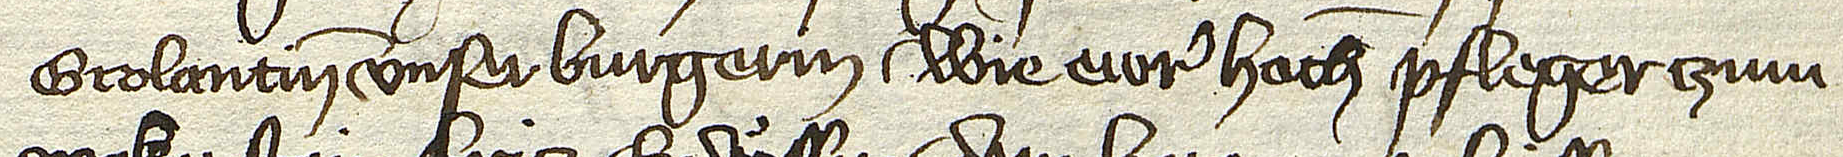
Grolantin vnſer burgerin / wie ewr* hoch* pfleger cʒum
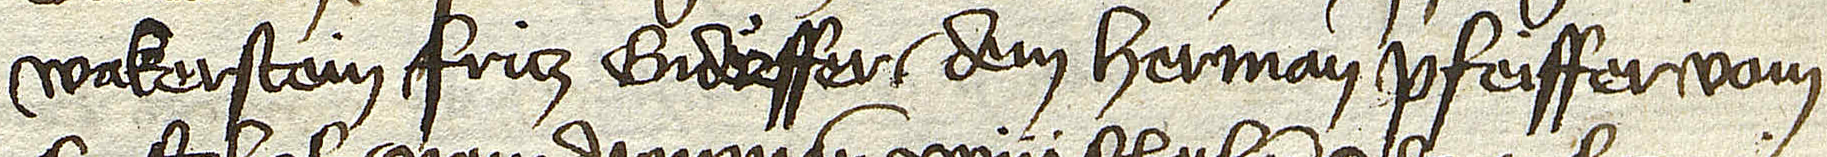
wakerſtein / fricʒ Endörffer / dem herman Pfeiffer vom
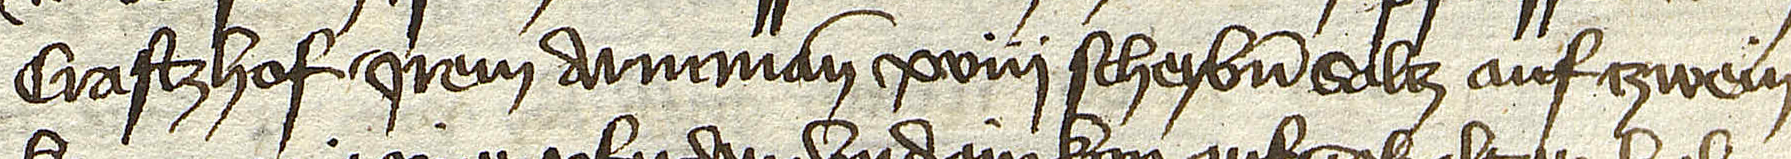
Crafcʒhof / Irem Armman* xviii ſcheybn* Salcʒ auf cʒwein
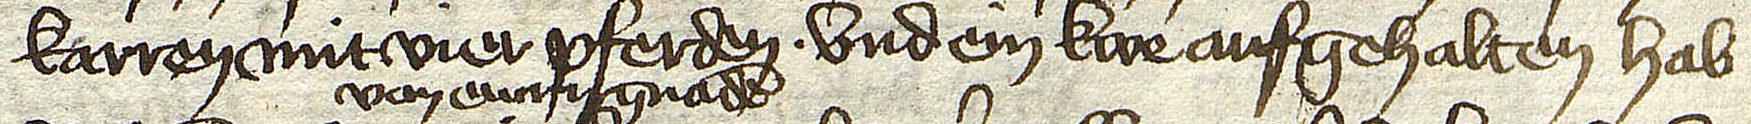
karren mit vier pferden . vnd ein kwe aufgehalten hab
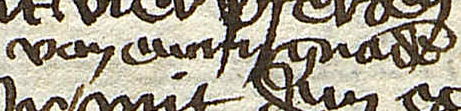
von ewrn gnade*
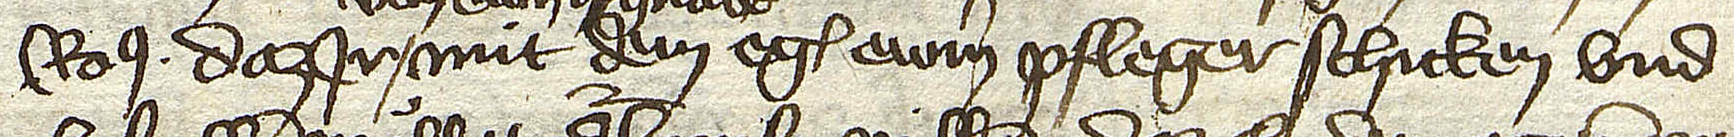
Ro* . daʒ Ir mit dem eg* ewm* pfleger ſchicken vnd
